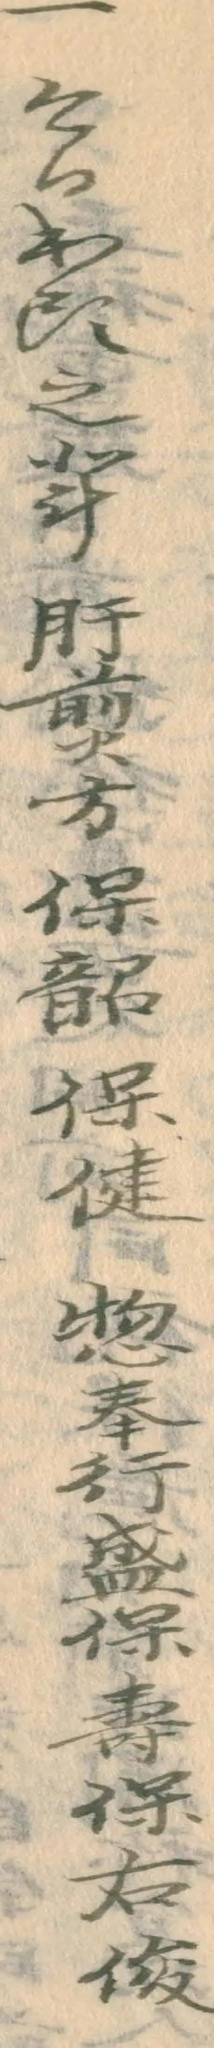一今日出頭之輩肝煎方保韶保健惣奉行盛保寿保右俊
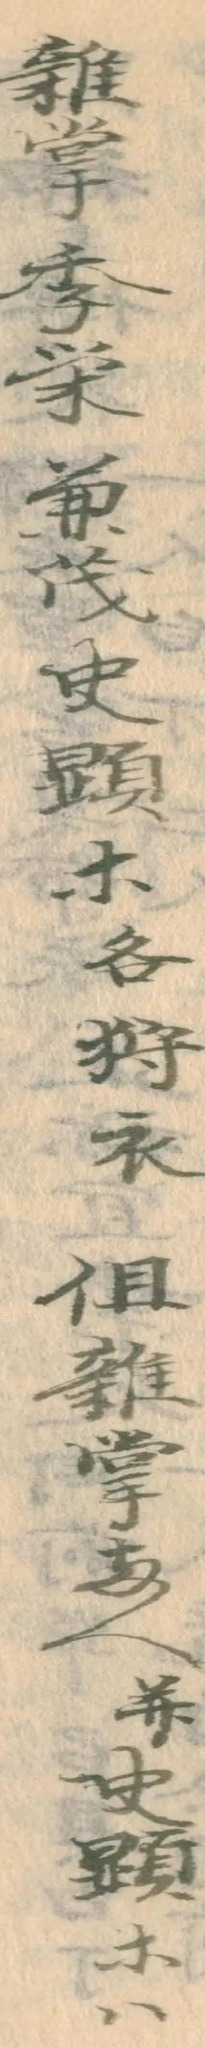雑掌季栄兼茂史顕等各狩衣但雑掌両人并史顕等ハ
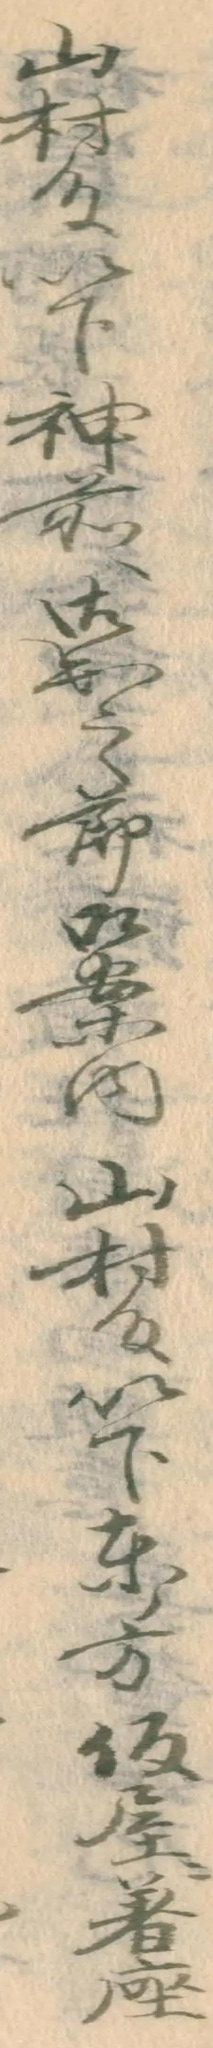山村殿以下神前へ御出之節御案内山村殿以下東ノ方仮屋ニ着座
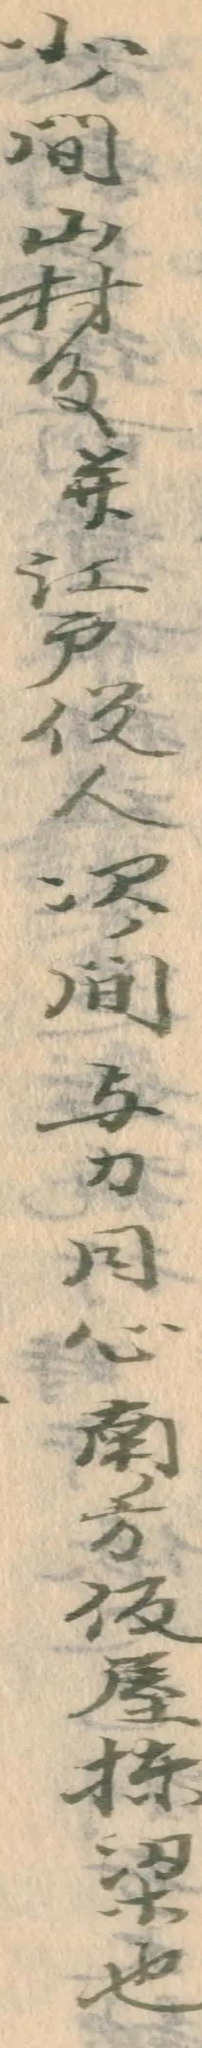北ノ間山村殿并江戸役人次ノ間与力同心南ノ方仮屋棟梁也
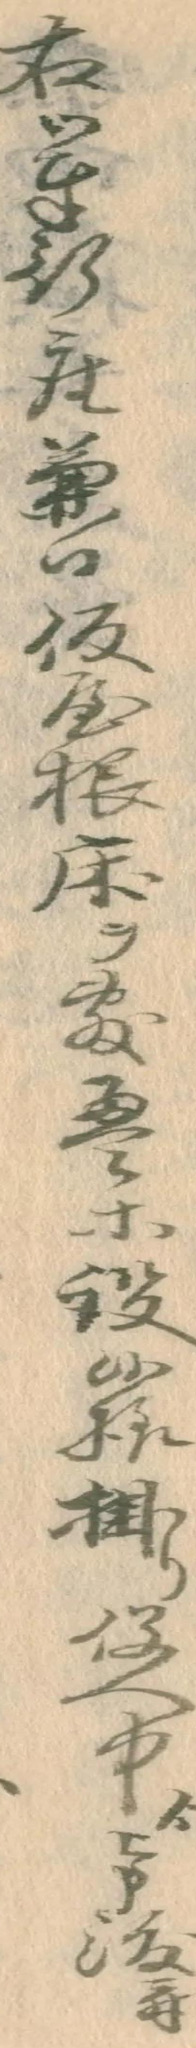右御奉行座兼日仮屋根床ヲ敷畳等設候様掛り役人中ゟ被申渡ニ付
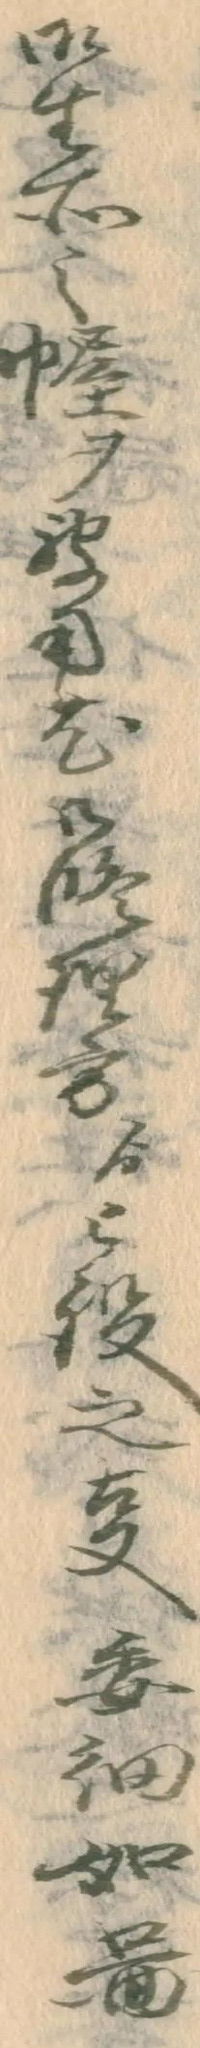御生所之幄ヲ被用尤御修理方ゟ被致之事委細如図

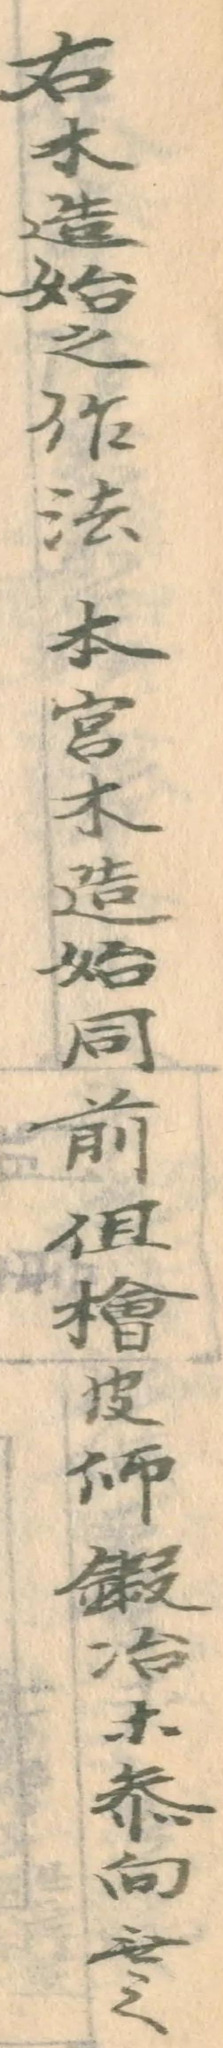右木造始之作法本宮木造始同前但檜皮師鍛冶等参向無之
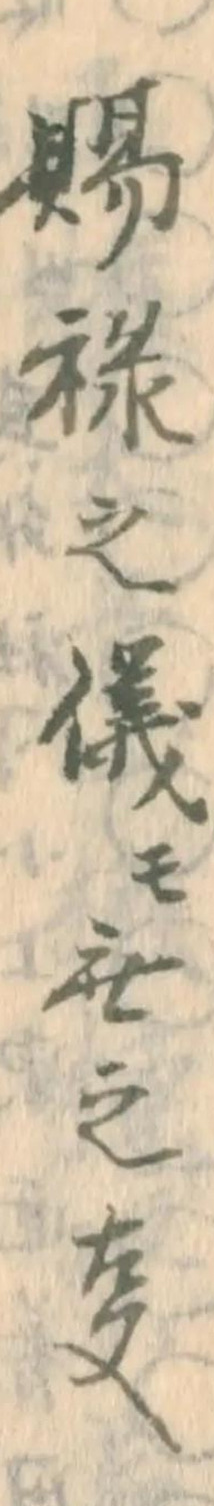賜禄之儀モ無之事
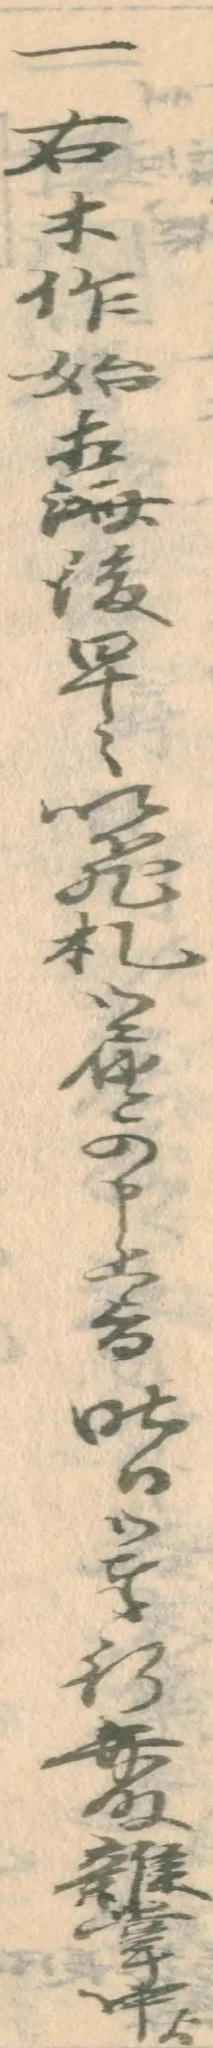一右木作始相済後早々以飛札御届可申上旨昨日御奉行弁殿雑掌中ゟ
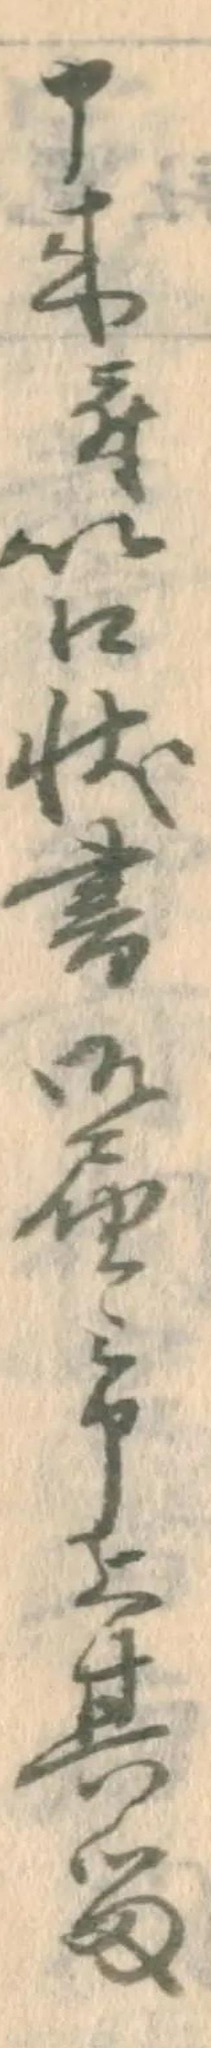申来ニ付以口状書御届被申上其留
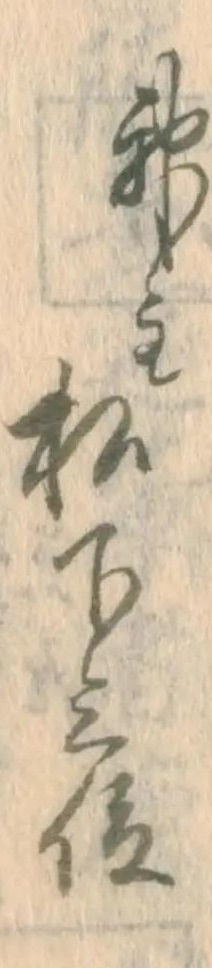松下三位
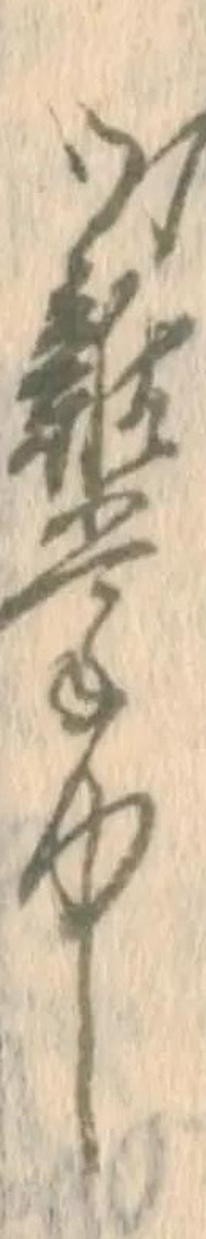御雑掌中
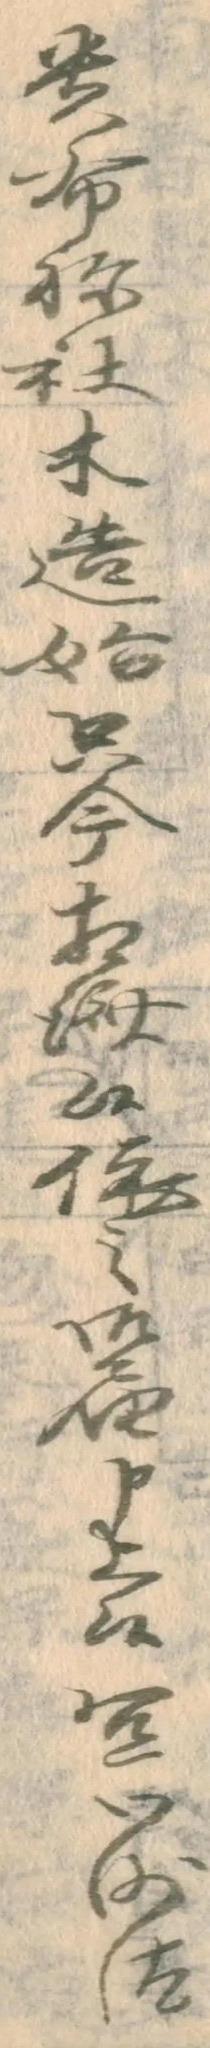貴布祢社木造始只今相済候依之御届申上候宜御沙汰
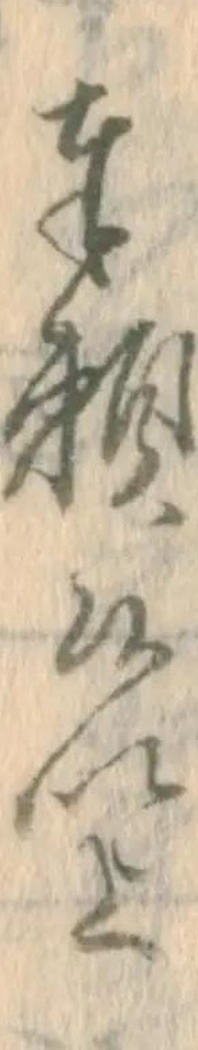奉頼候以上
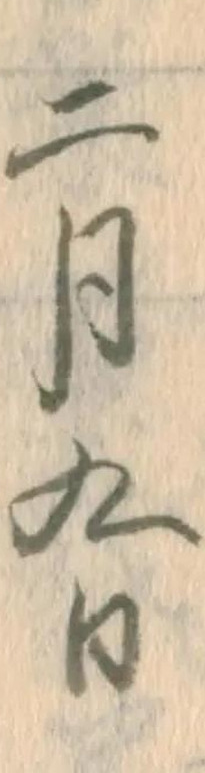二月九日
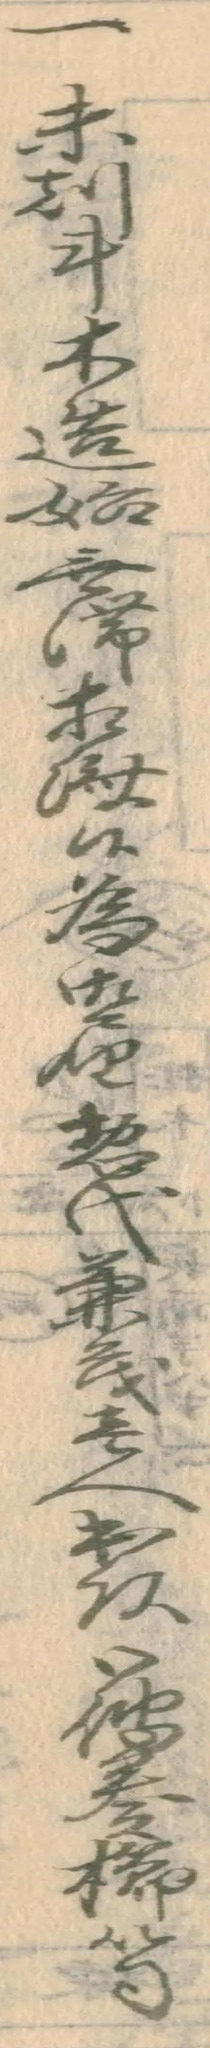一未刻計木造始無滞相済候為御届惣代兼茂壱人出頭御伝奏櫛笥
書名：賀茂社記録. 第17冊
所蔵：国立国会図書館 National Diet Library, JAPAN
